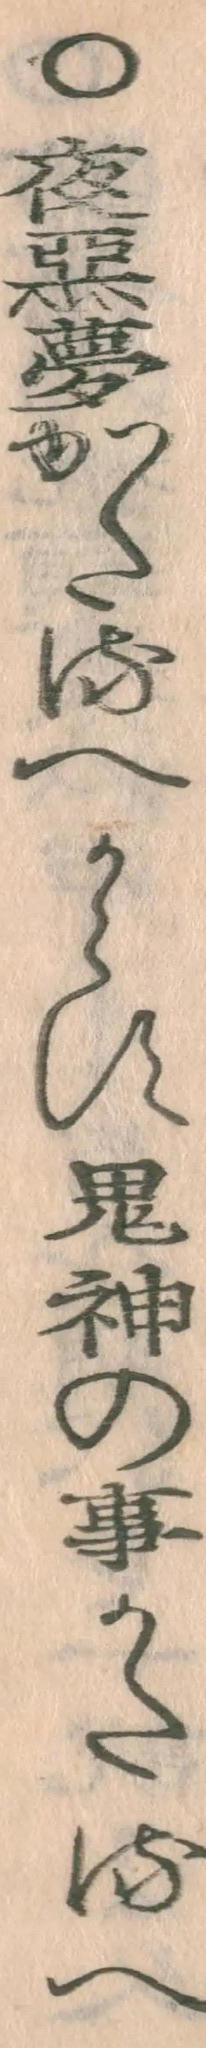〇夜悪夢かたるへからす鬼神の事かたるへ
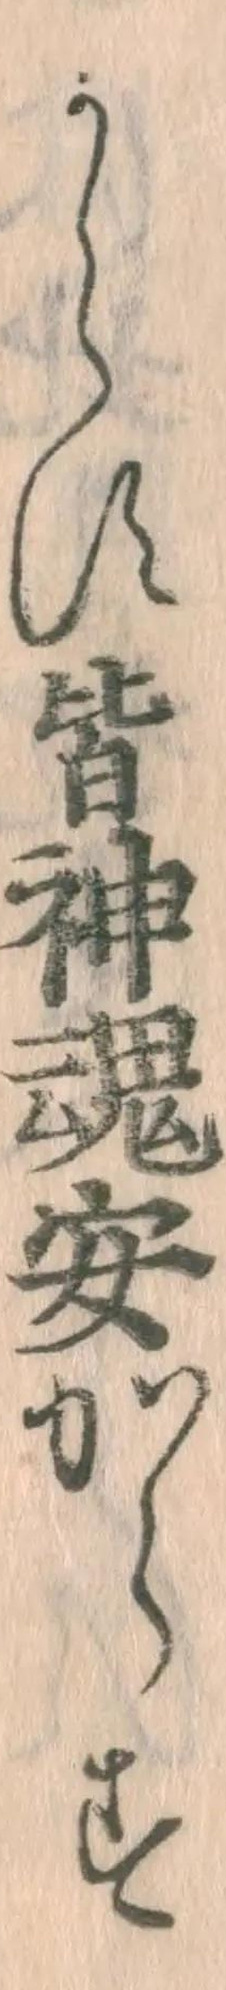からす皆神魂安からす
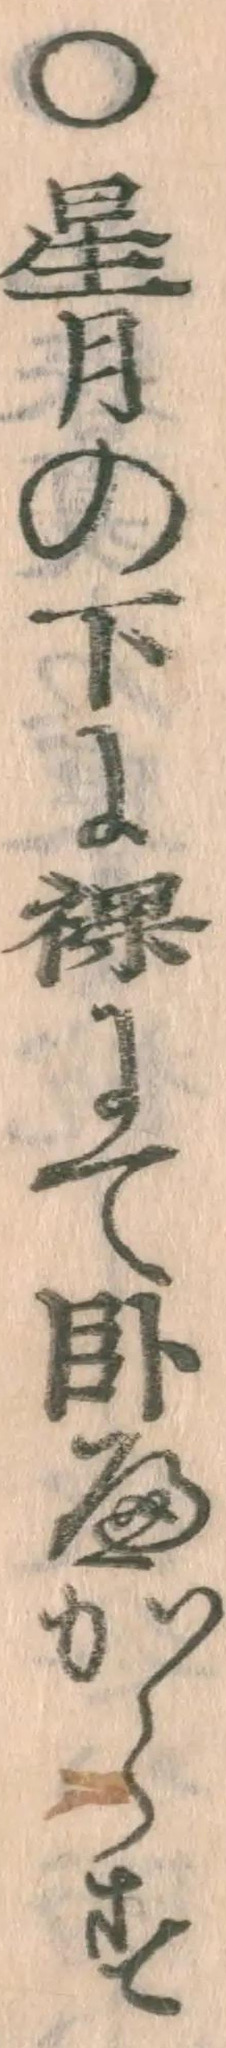〇星月の下に裸にて臥へからす
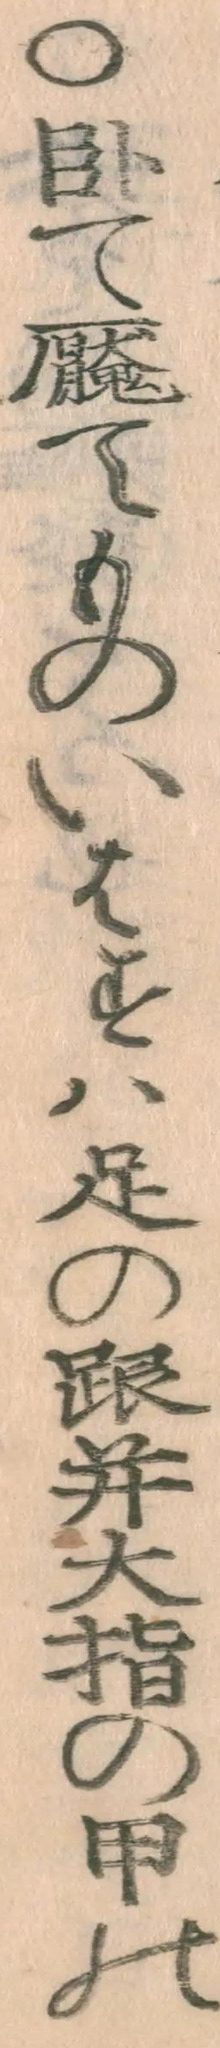〇臥て魘てものいはすは足の跟并大指の甲の
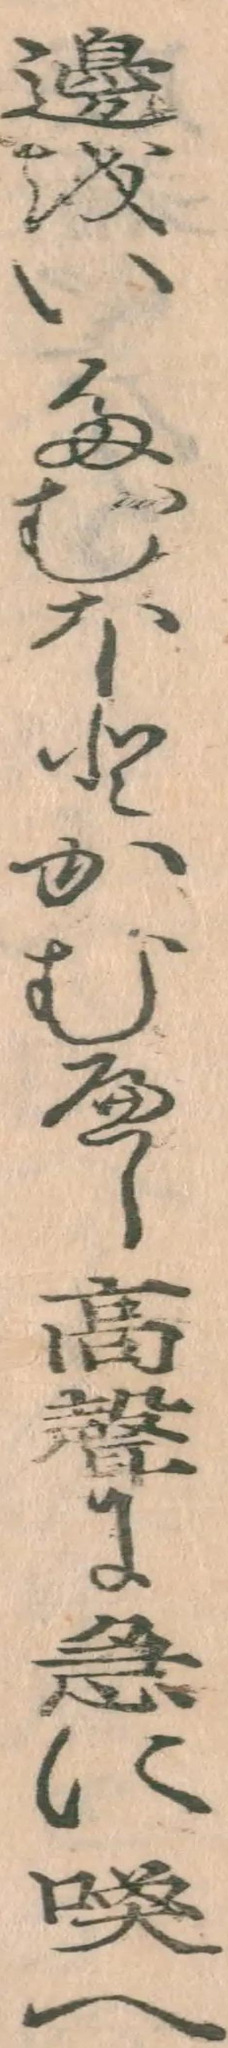辺をいたむほとかむへし高声に急に喚へ
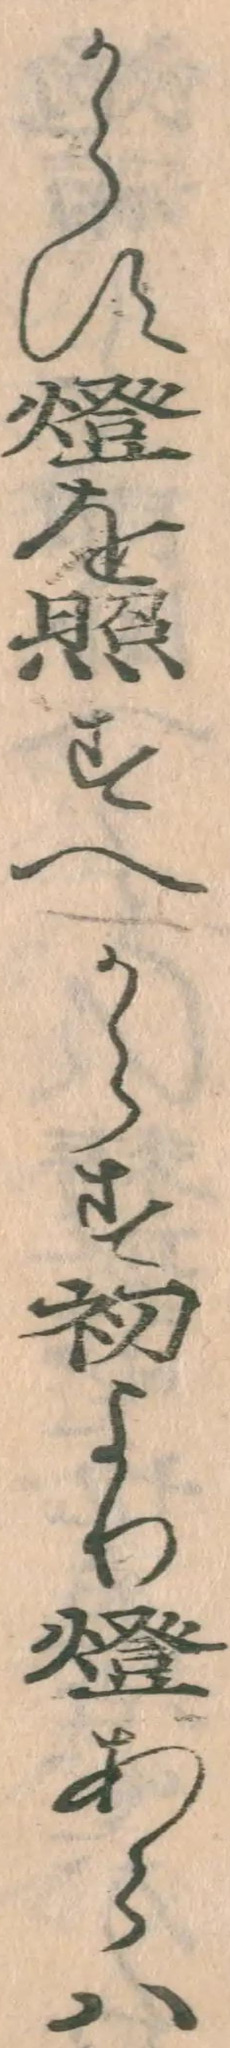からす灯を照すへからす初より灯あらは
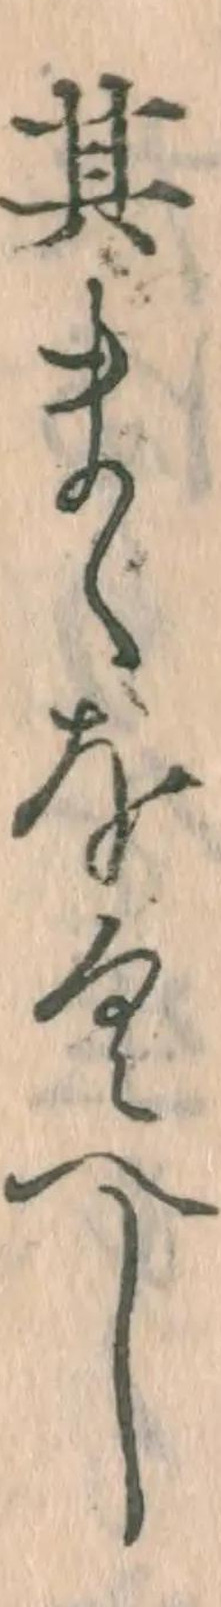其まゝをくへし
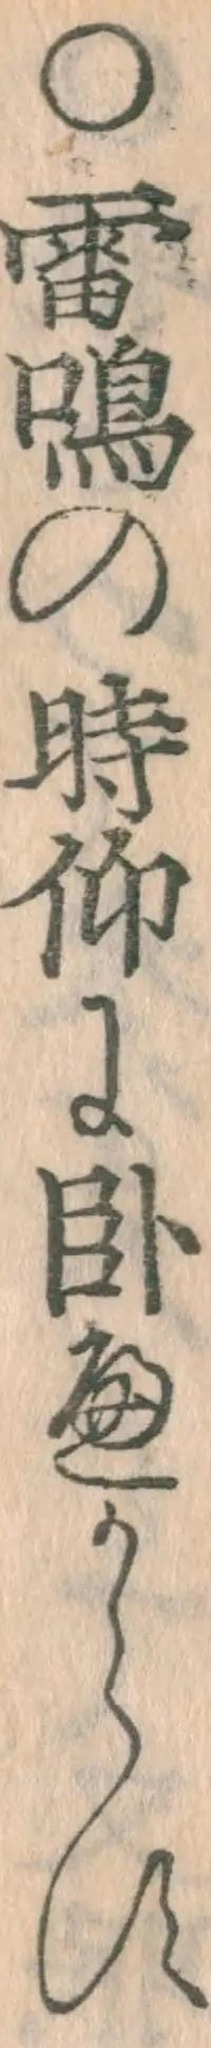〇雷鳴の時仰に臥へからす
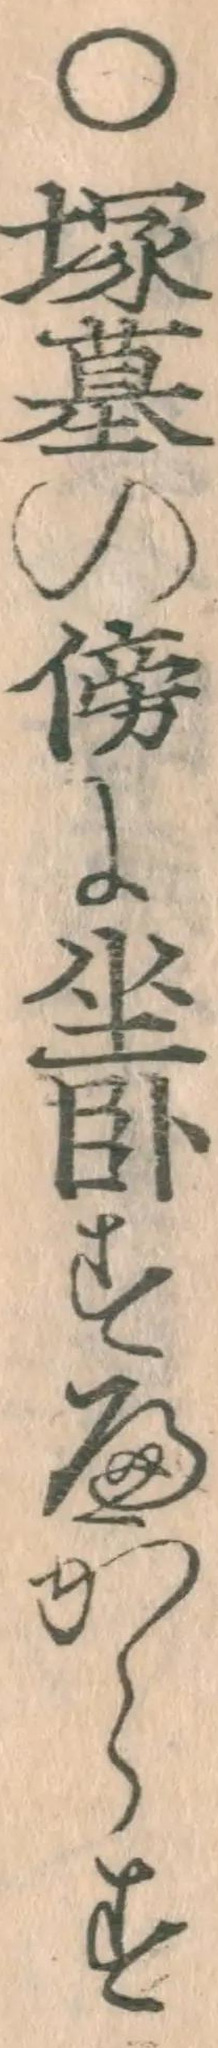〇塚墓の傍に坐臥すへからす
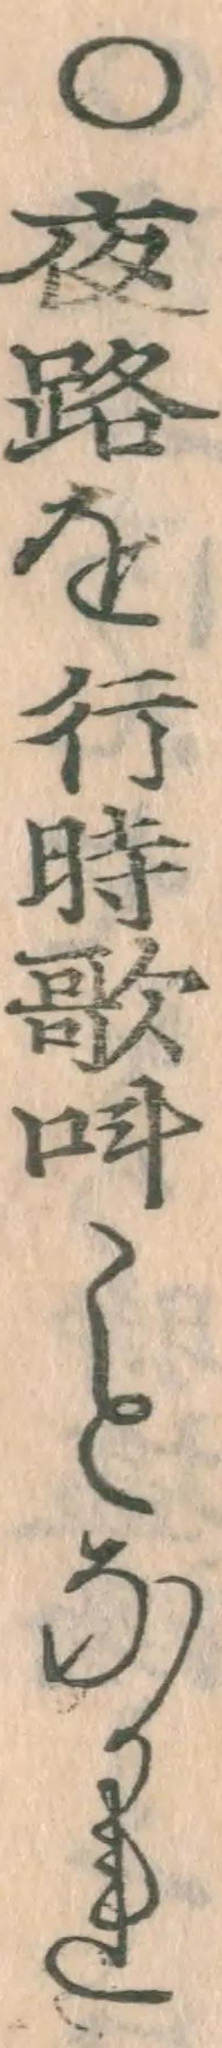〇夜路を行時歌叫ことなかれ
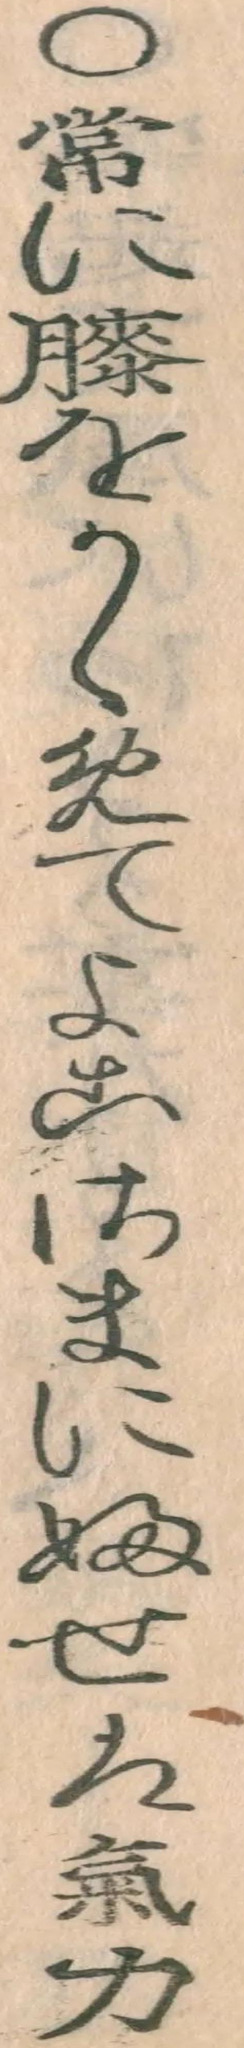〇常に膝をかゝめてよこさまにふせは気力
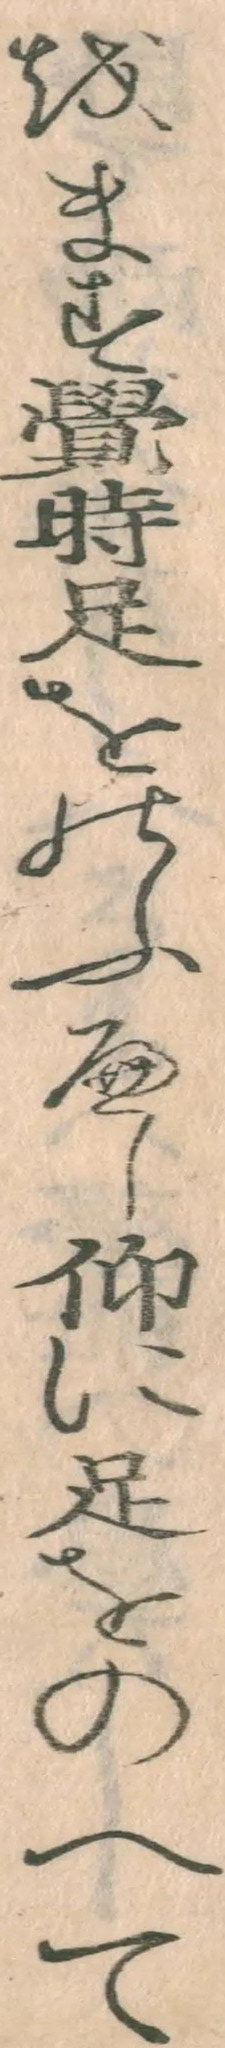をます覚時足をのふへし仰に足をのへて
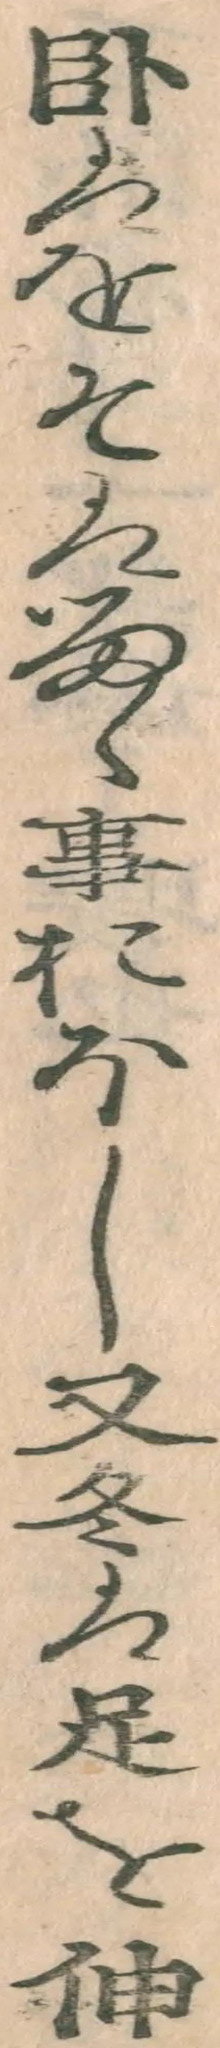臥はをそはるゝ事おほし又冬は足を伸

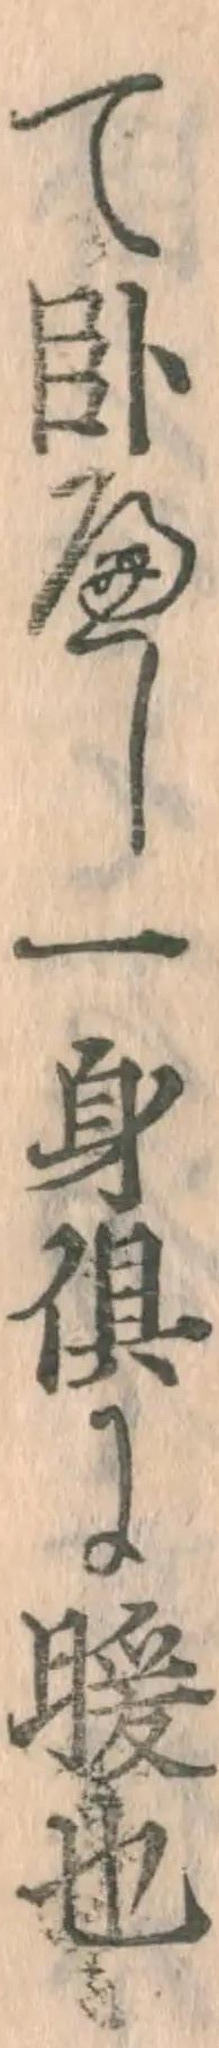て臥へし一身俱に暖也
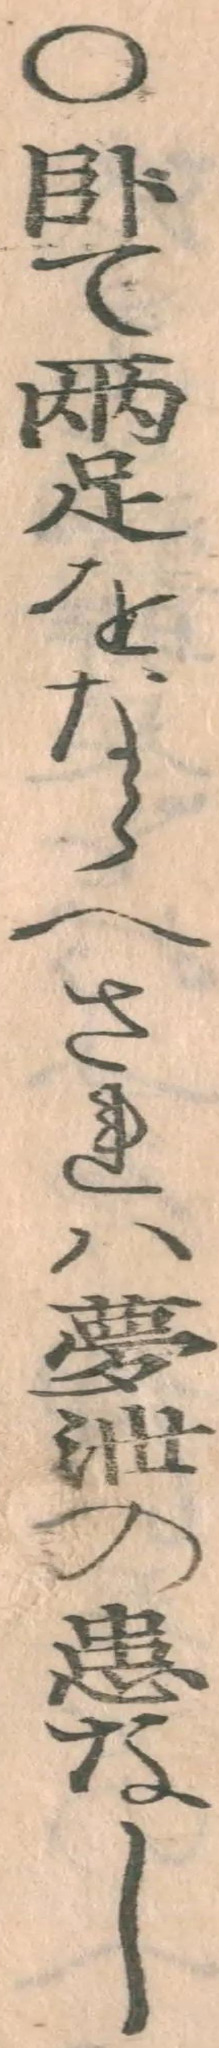〇臥て両足をならへされは夢泄の患なし
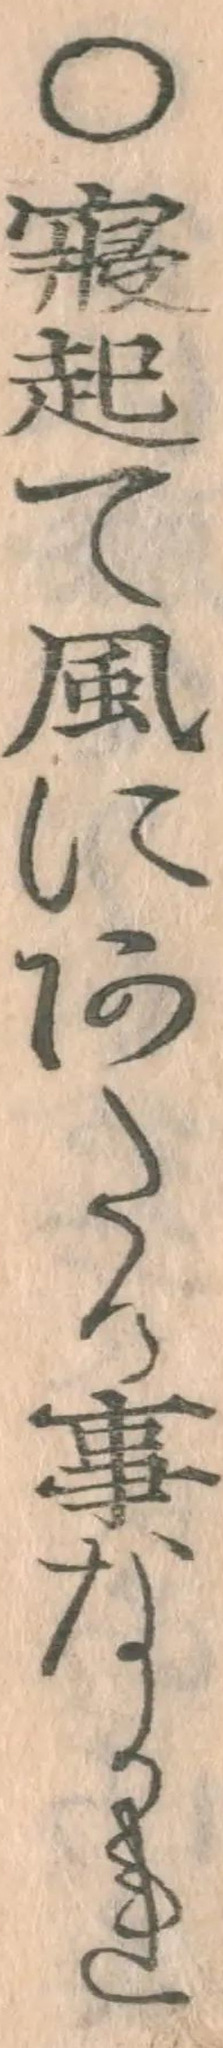〇寝起て風にあたる事なかれ
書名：延壽撮要
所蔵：国立国会図書館 National Diet Library, JAPAN
